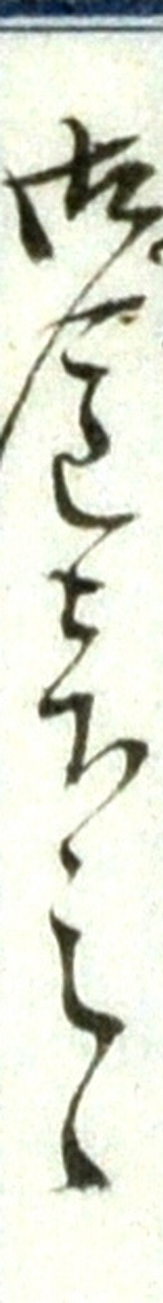御金被下之候
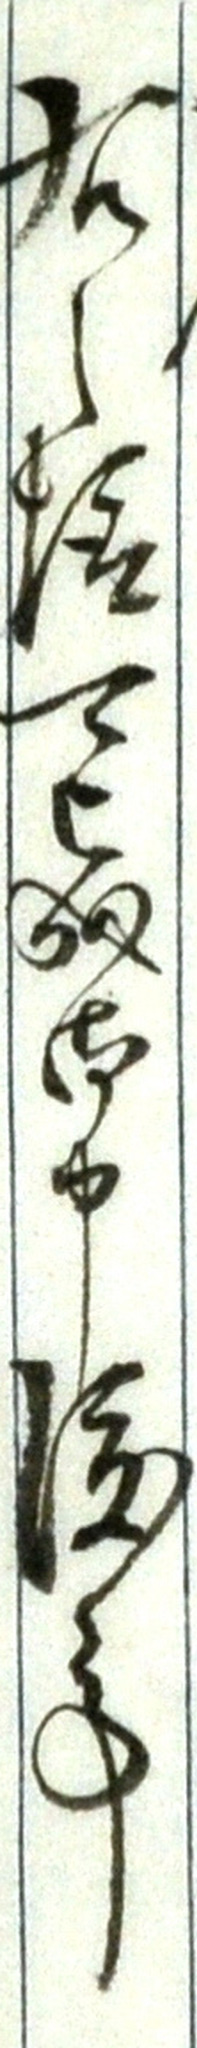右之趣可被成御申渡候事
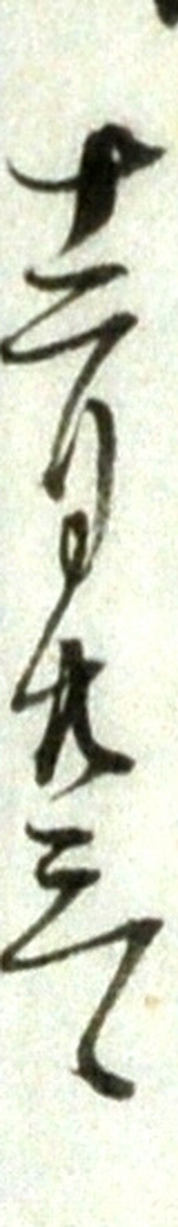十二月廿三日
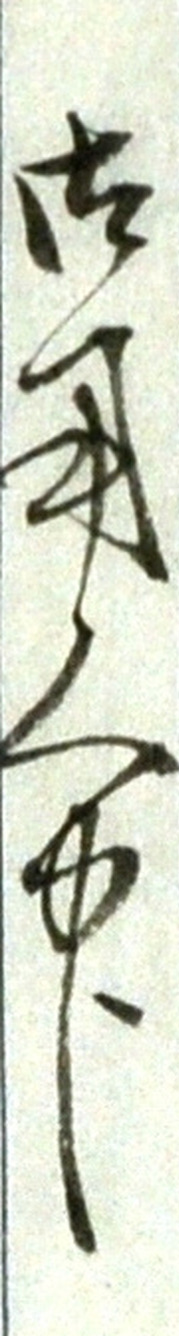御用人中
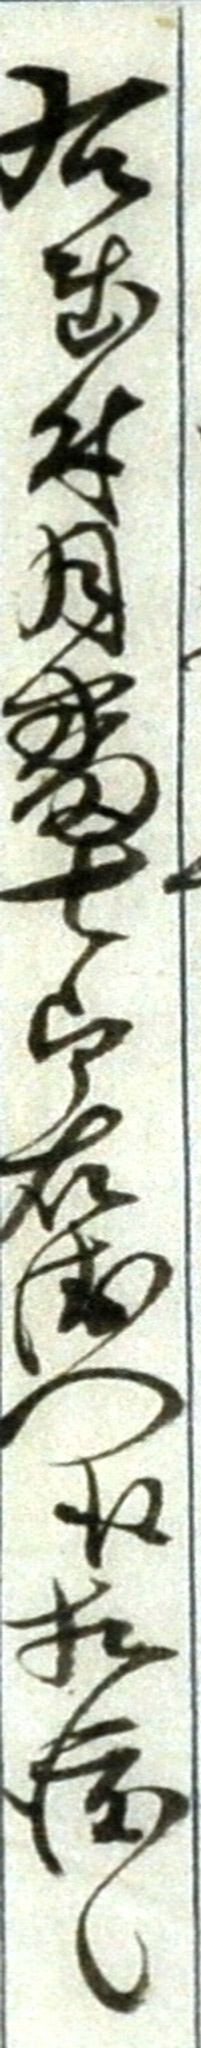右書付月番七郎右衛門江相渡候

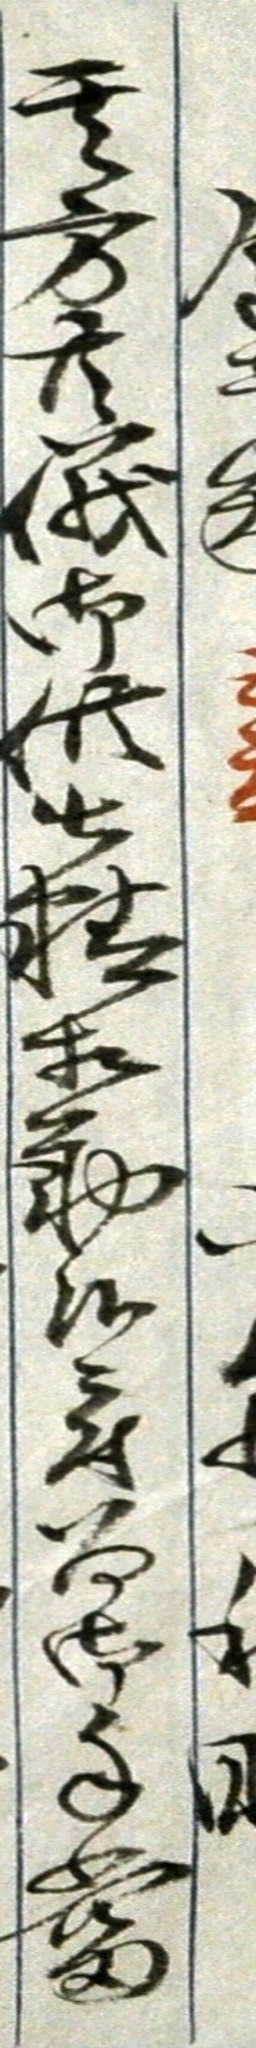其方共御供出精相勤候ニ付為御手當
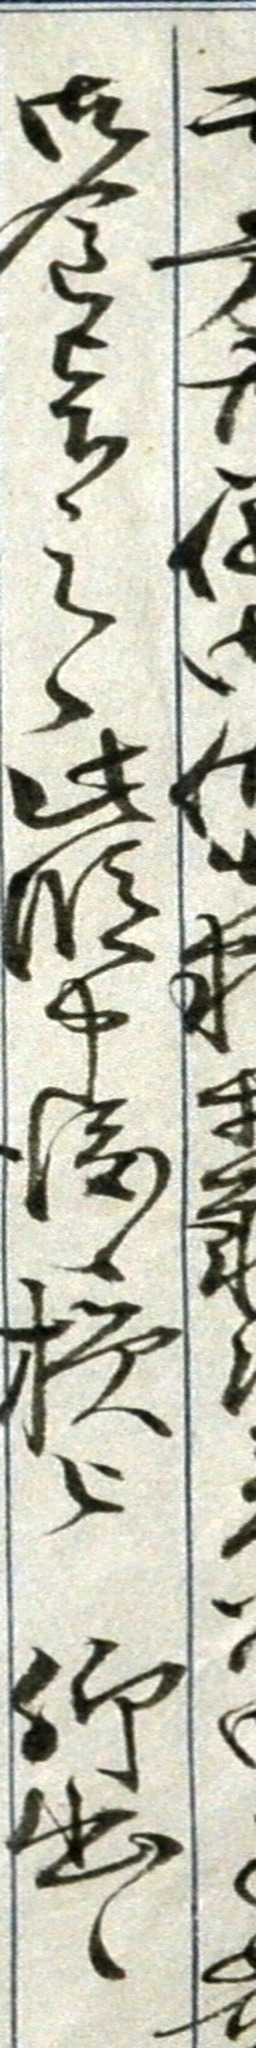御金被下之候此段申渡候様被仰出候
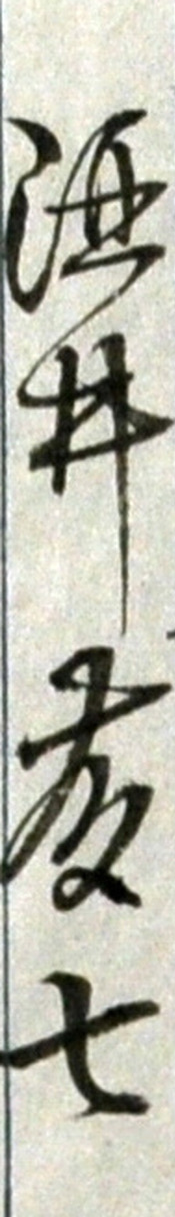酒井藤七
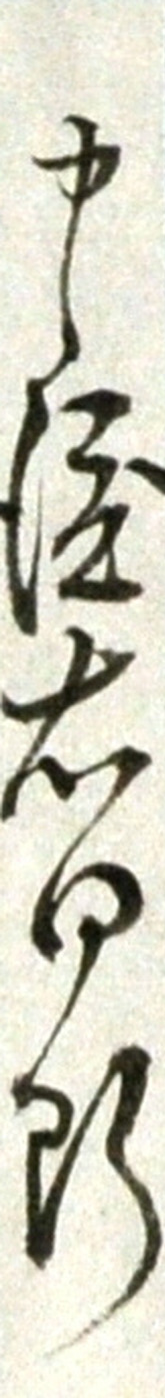申渡右同断
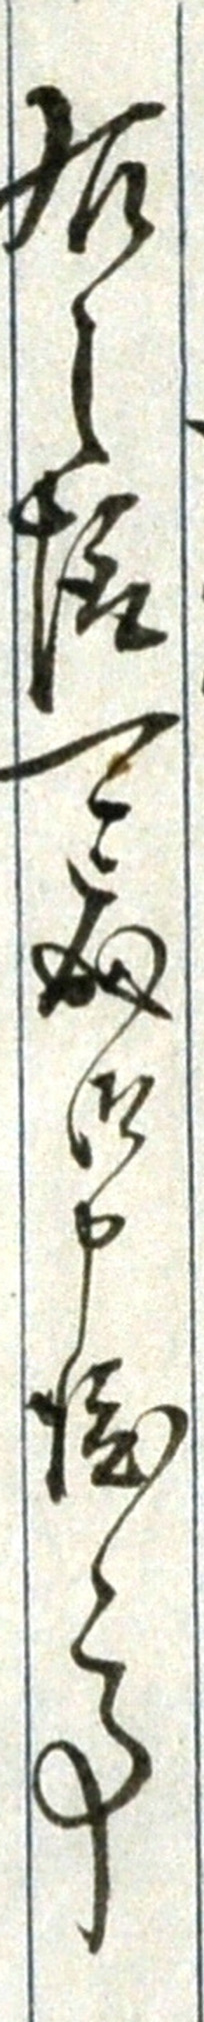右之趣可被成御申渡候事
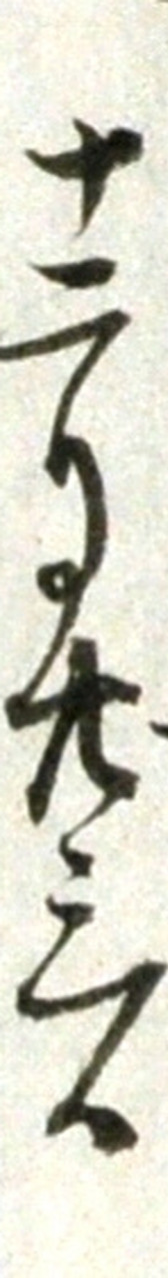十二月廿三日
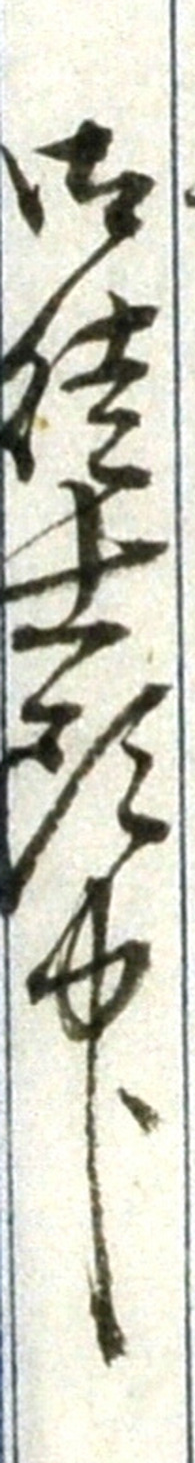御徒士頭中
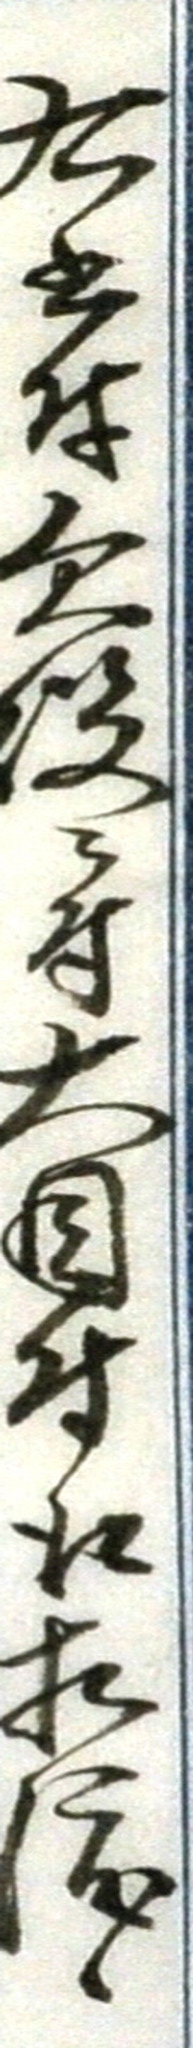右書付欠役ニ付大目付江相渡候
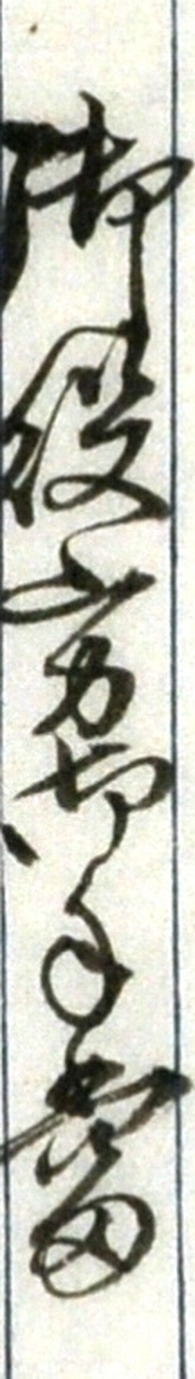御役方御手當
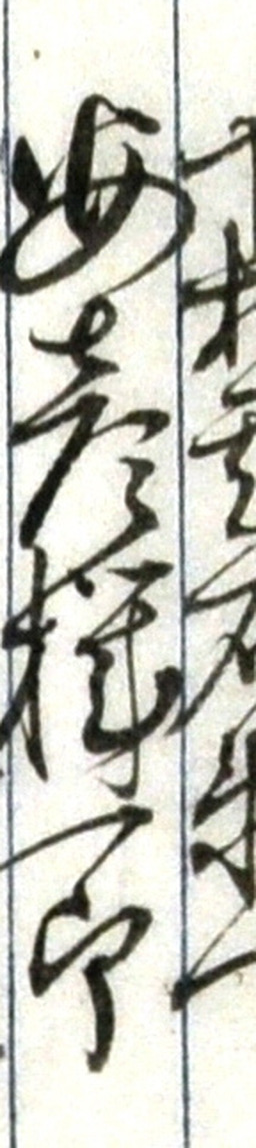安彦權一郎
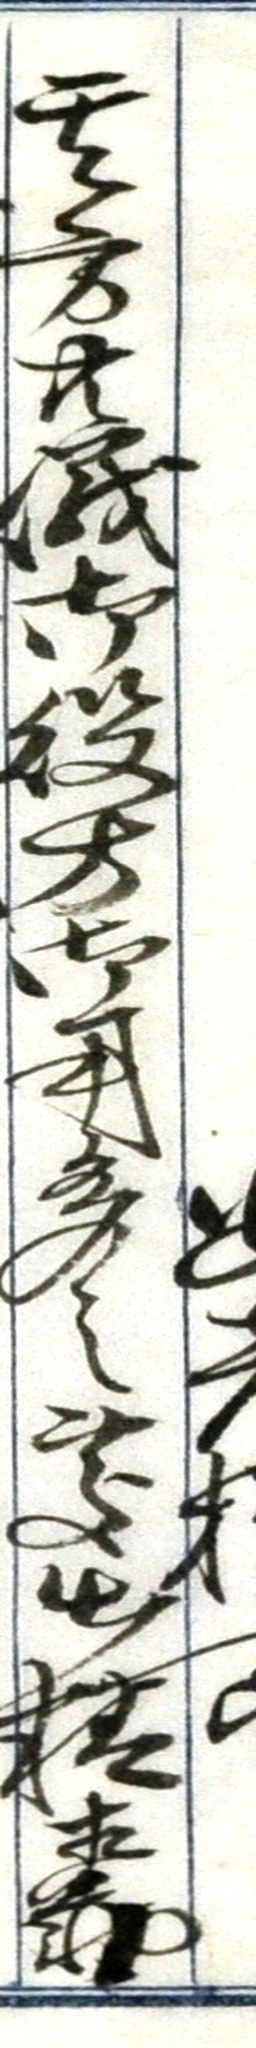其方共御役方御用多之處出精相勤
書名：上方ヨリ御帰府之後江戸勤并江戸在番中之者江被下・控
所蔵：伊那市立高遠町図書館・合同会社AMANE
